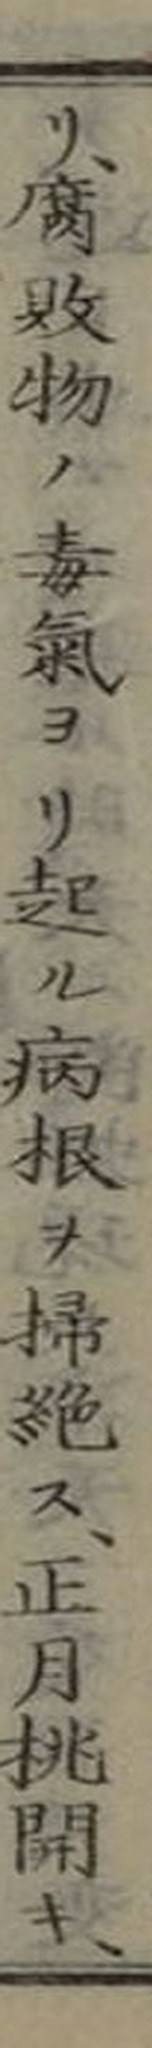リ、腐敗物ノ毒気ヨリ起ル病根ヲ掃絶ス、正月桃開キ、
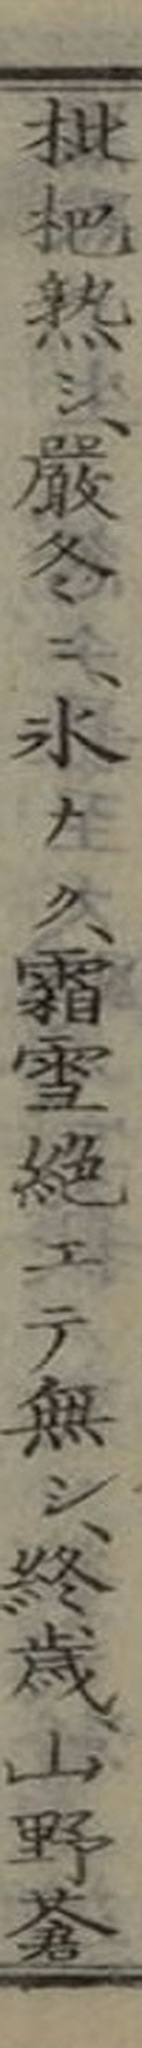枇杷熟シ、厳冬ニ、氷ナク、霜雪絶エテ無シ、終歳、山野蒼
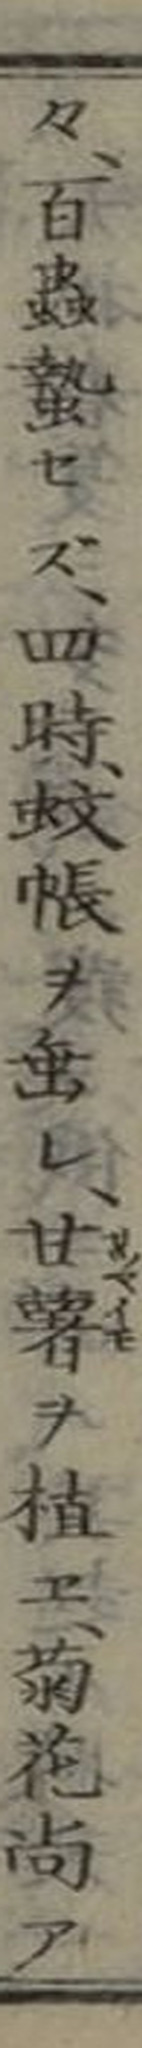々、百虫蟄セズ、四時、蚊帳ヲ垂レ、甘薯ヲ植ヱ、菊花尚ア
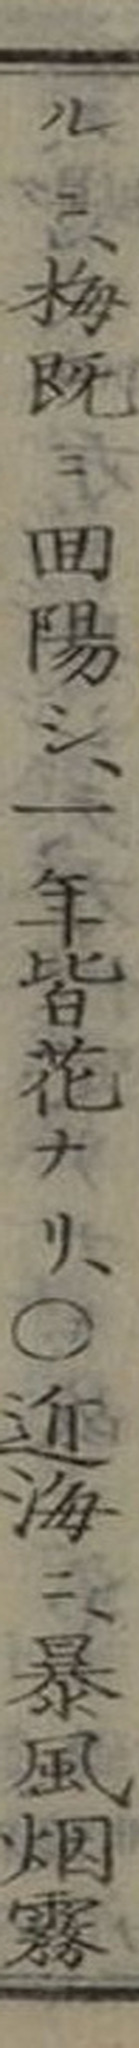ルニ、梅既ニ回陽シ、一年皆花ナリ、○近海ニ、暴風煙霧
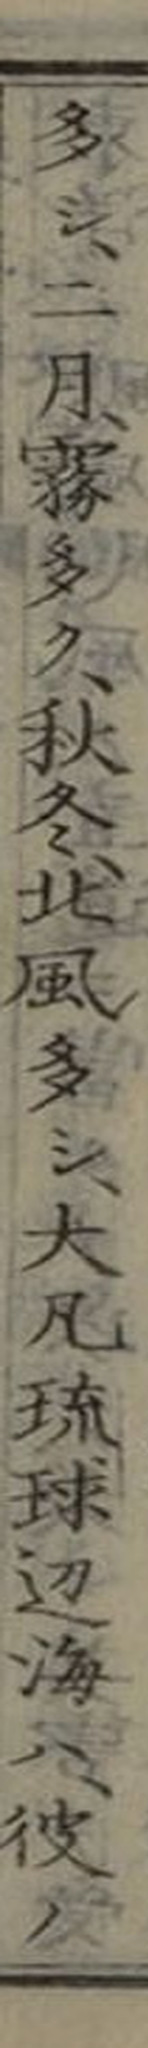多シ、二月、霧多ク、秋冬、北風多シ、大凡琉球辺海ハ、彼ノ

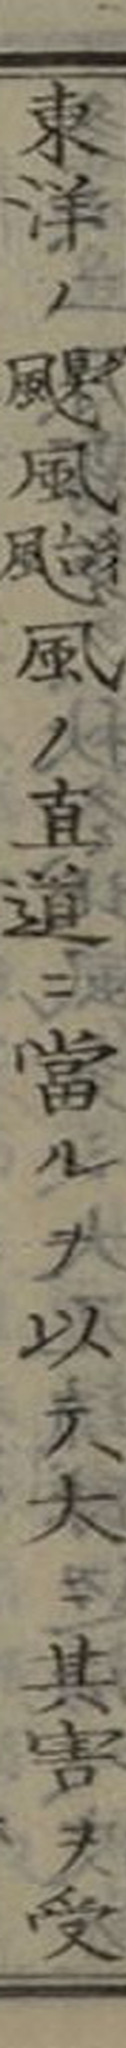東洋ノ颶風颱風ノ直道二当ルヲ以テ、大ニ其害ヲ受
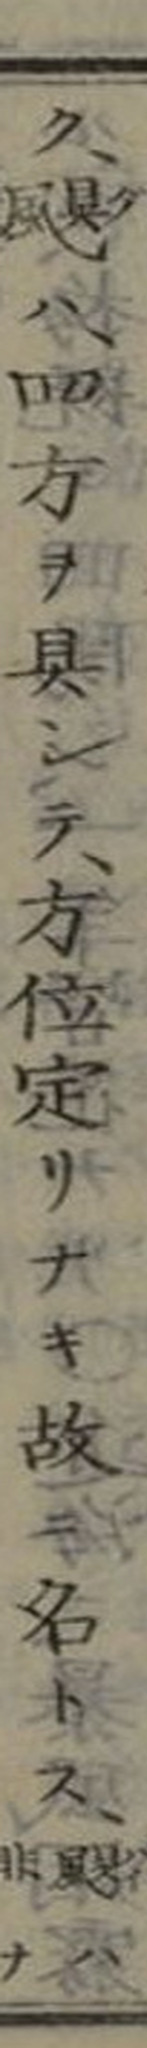ク、颶ハ、四方ヲ具シテ、方位定リナキ故ニ名トス、ハ非ナ
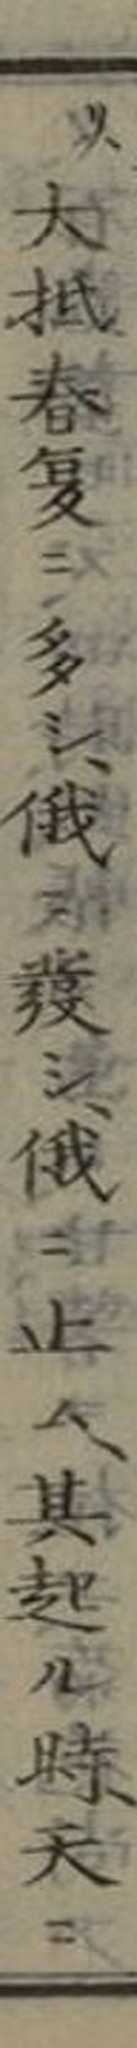リ、大抵春夏ニ多シ、俄ニ発シ、俄ニ止ム、其起ル時、天ニ
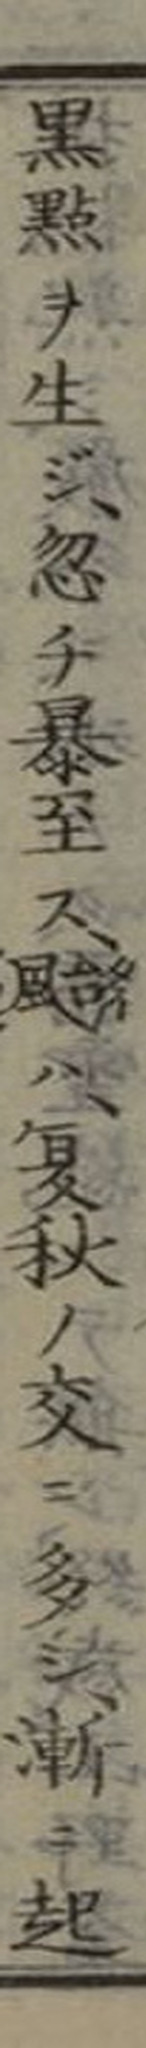黒点ヲ生ジ、忽チ暴至ス、颱ハ、夏秋ノ交ニ多シ、漸ニ起
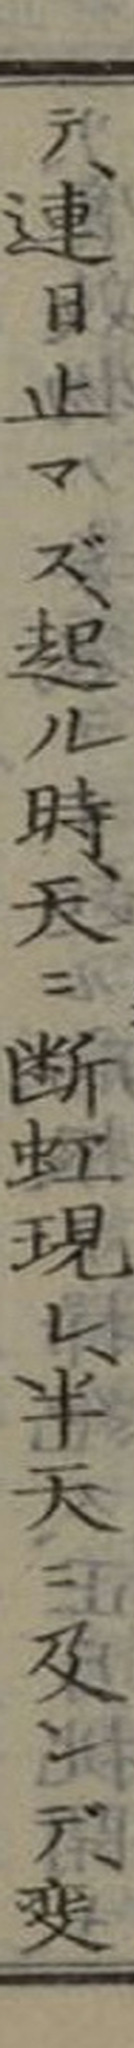テ、連日止マズ、起ル時、天ニ断虹現レ、半天ニ及ンデ、変
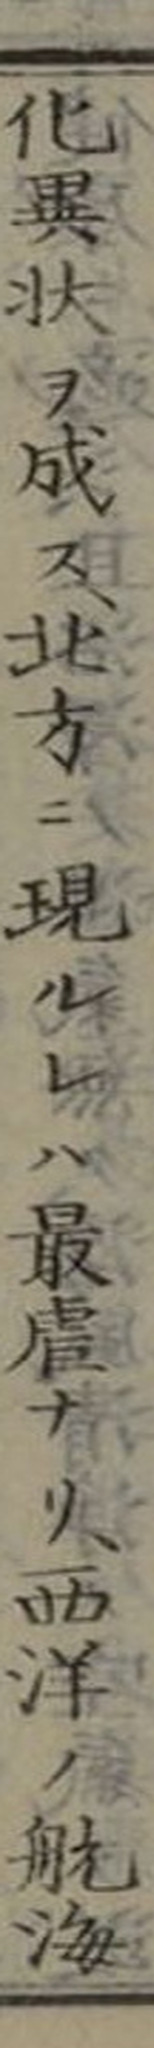化異状ヲ成ス、北方ニ現ルレハ最虐ナリ、西洋ノ航海
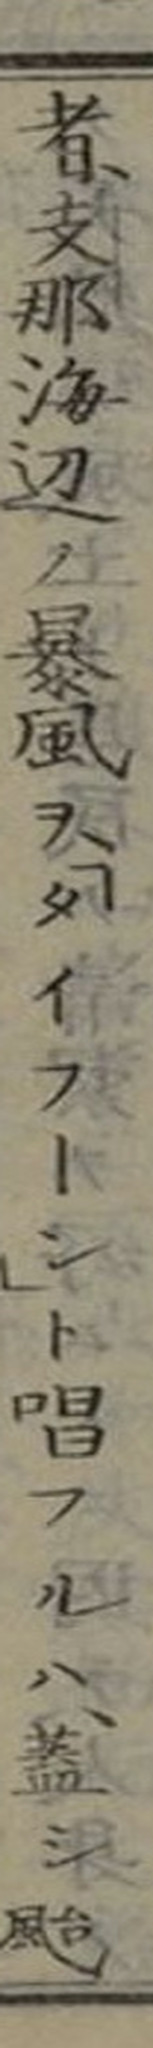者、支那海辺ノ暴風ヲ、「タイフーン」ト唱フルハ、蓋シ颱
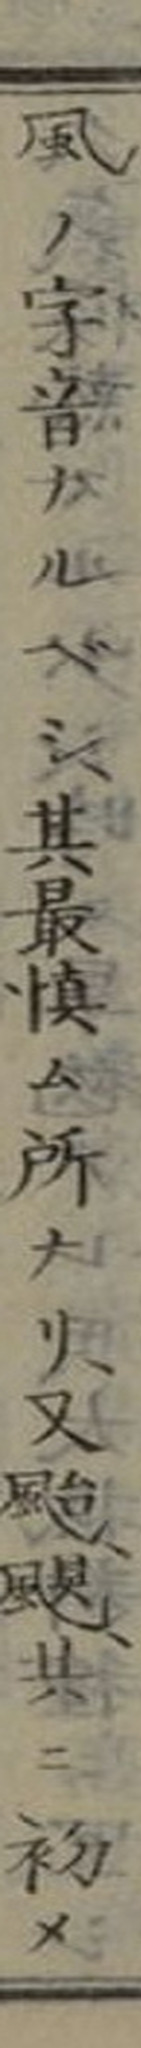風ノ字音ナルベシ、其最慎ム所ナリ、又颱、颶、共ニ初メ
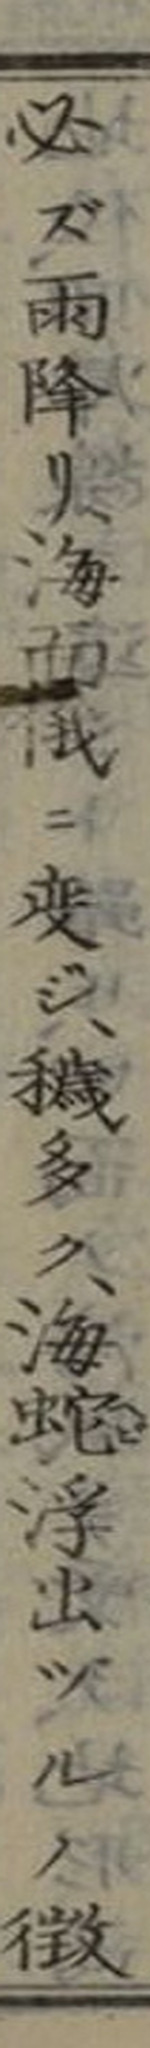必ズ雨降リ、海面俄ニ変ジ、穢多ク、海蛇浮出ヅルノ徴
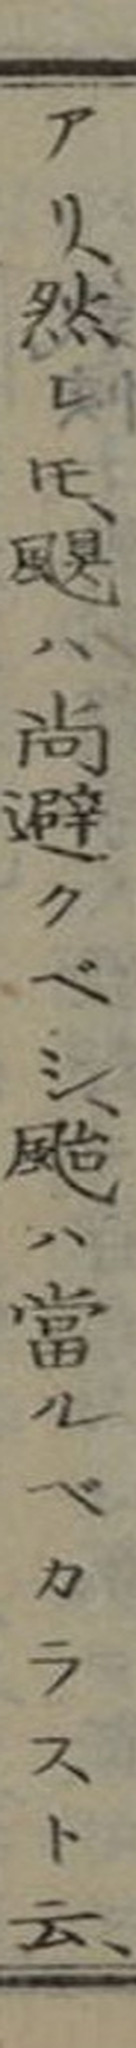アリ、然レトモ、颶ハ尚避クベシ、颱ハ当ルベカラスト云、
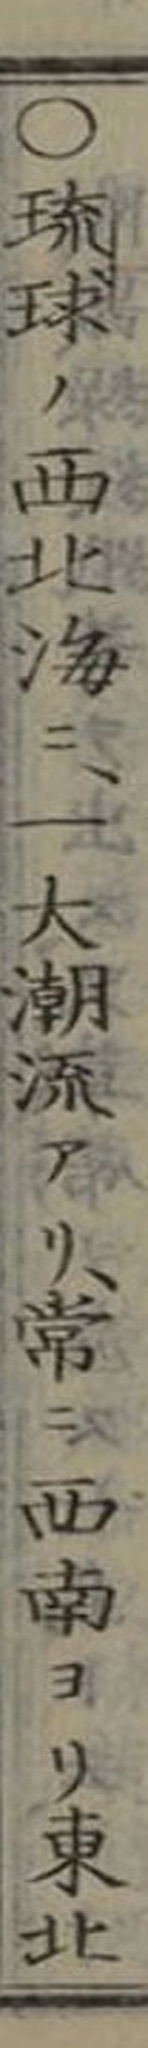○琉球ノ西北海ニ、一大潮流アリ、常ニ西南ヨリ東北
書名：琉球新誌 図附 上
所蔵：University of the Ryukyus Library
